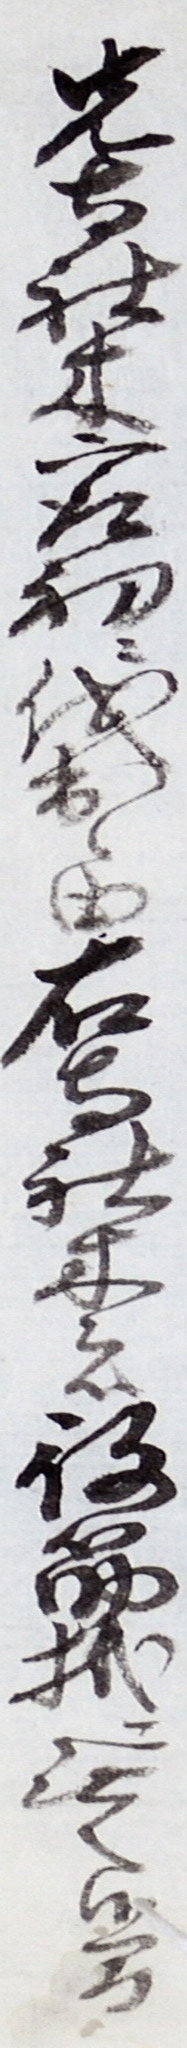先寺社木最初ニ伐出候由右寺社木は役筋掛ニ無之候間
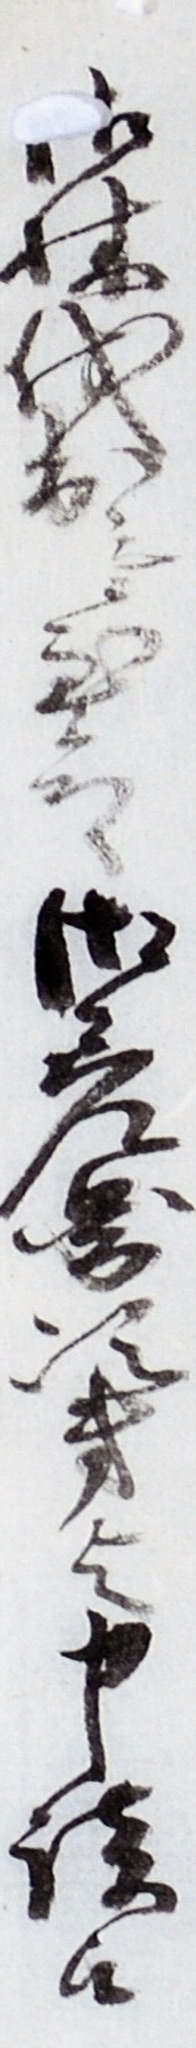御林伐出し候事は御差図次第と申談候
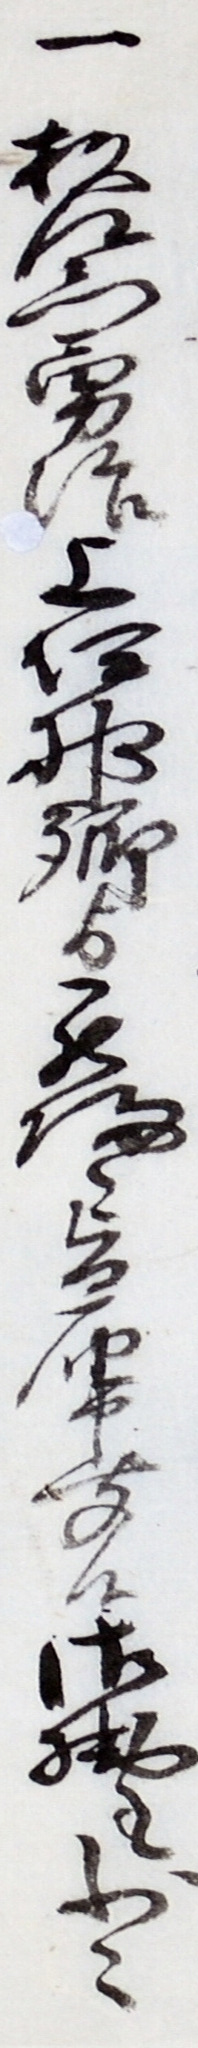一杉左衛門勇治上伊神郷より罷帰候旨届申聞候御払も少々
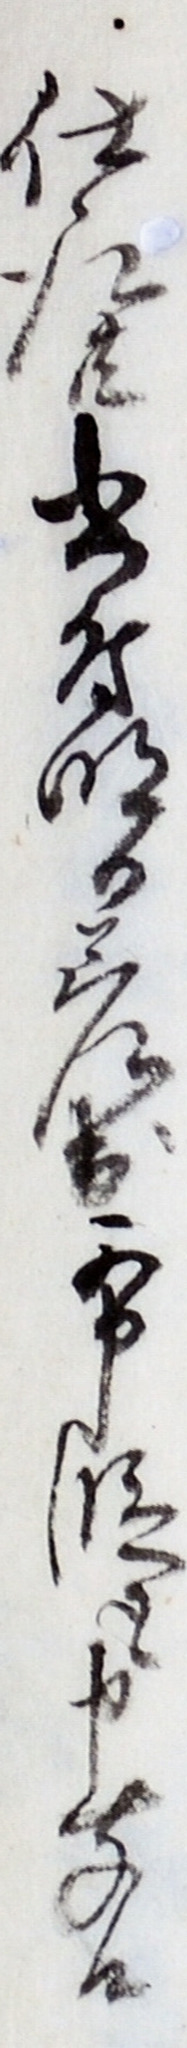仕候得共書付明日差出可申段も申聞候
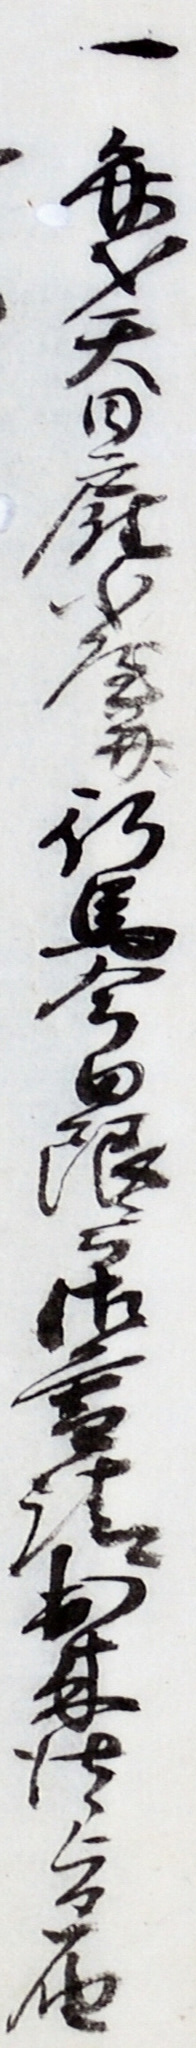一弁才天日雇小屋并行馬今日限ニ而御普請江出来仕候旨届
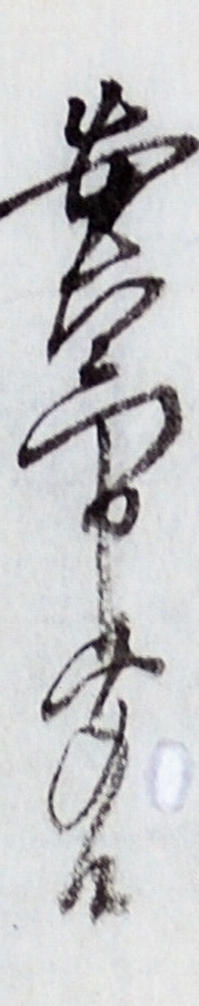安右衛門申聞候
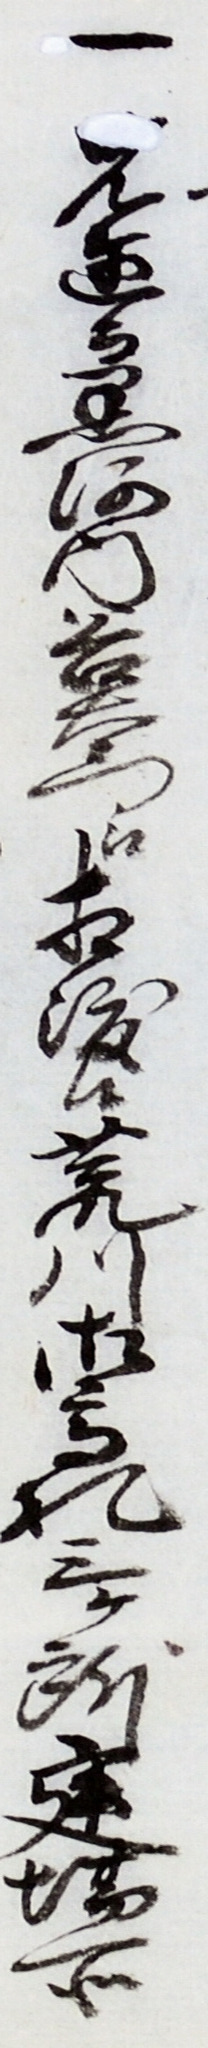一先達而黒河内善右衛門江相渡候荒川御高札三ヶ所建場所
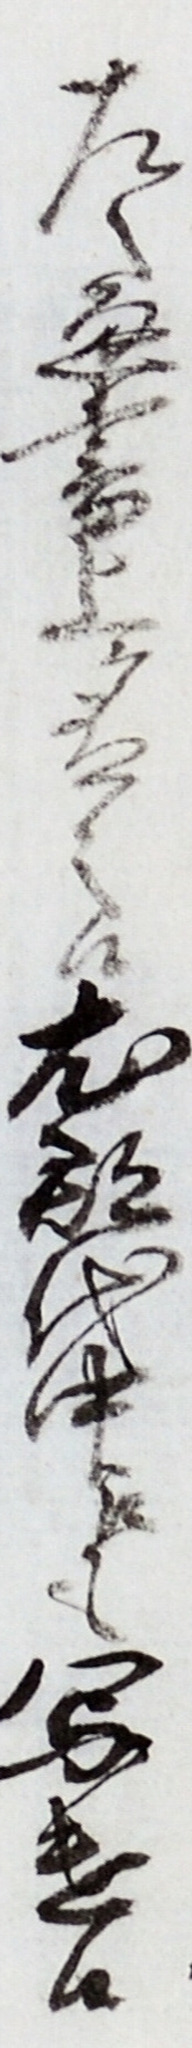左之通書上ケ有之候尤郡代中江も写遣候
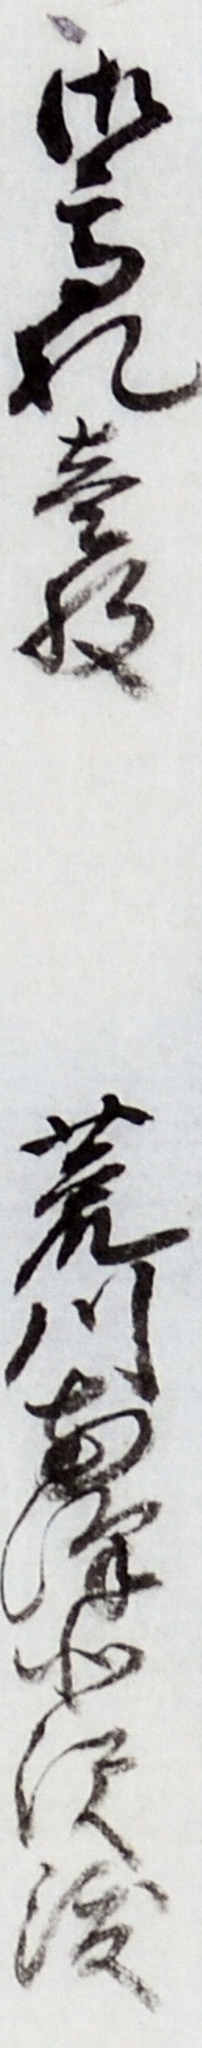御高札壱枚荒川南沢北沢渡
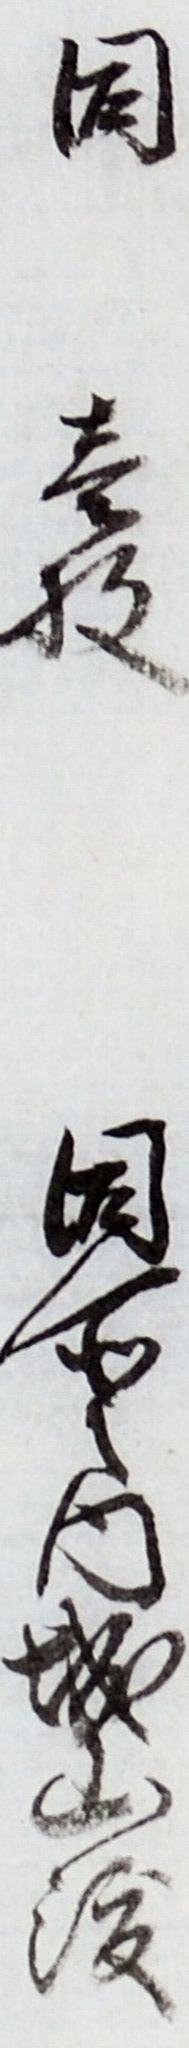同壱枚同所之内城山渡
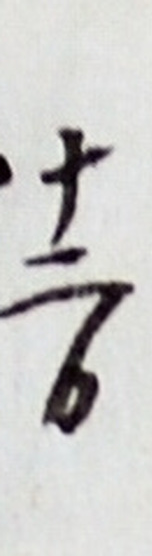十二日
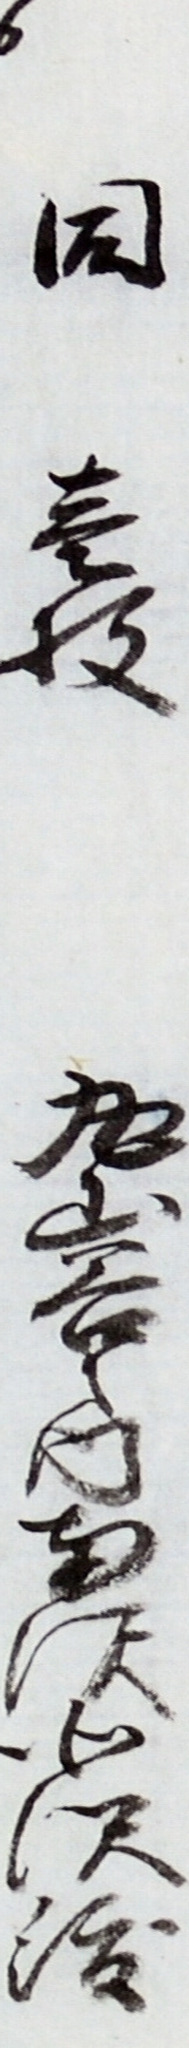同壱枚丸山谷之内南沢北沢渡
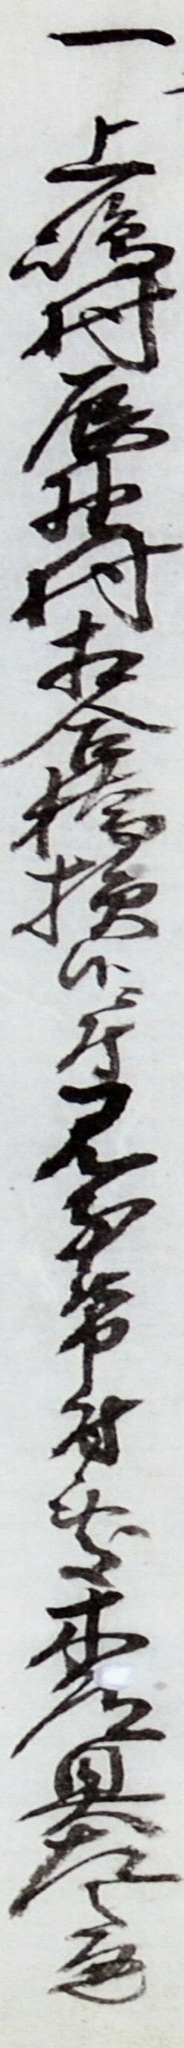一上嶋村辰野村相合橋損候ニ付見分被申付候処木道具左之通
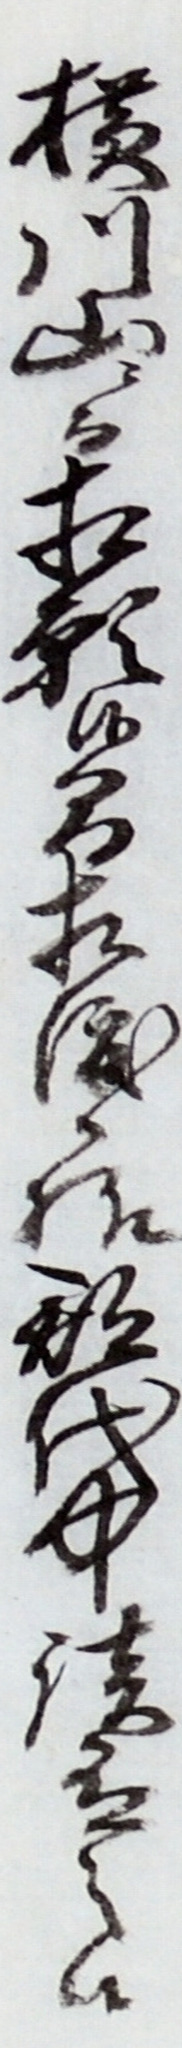横川山ニ而相願候間相渡候様郡代中談有之候
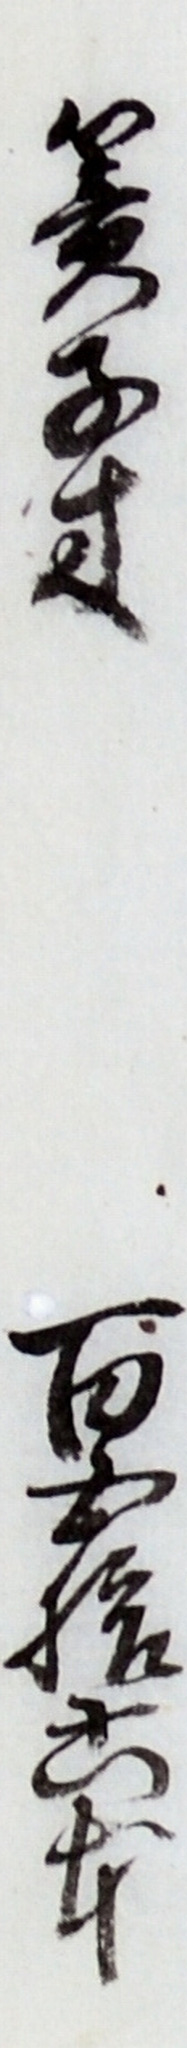簀子木百五拾六本

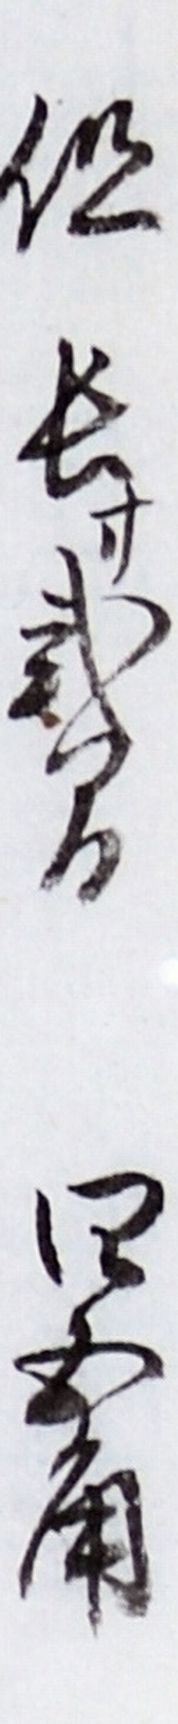但長サ弐間四五角
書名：御山奉行御用控
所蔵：伊那市立高遠町図書館・合同会社AMANE
